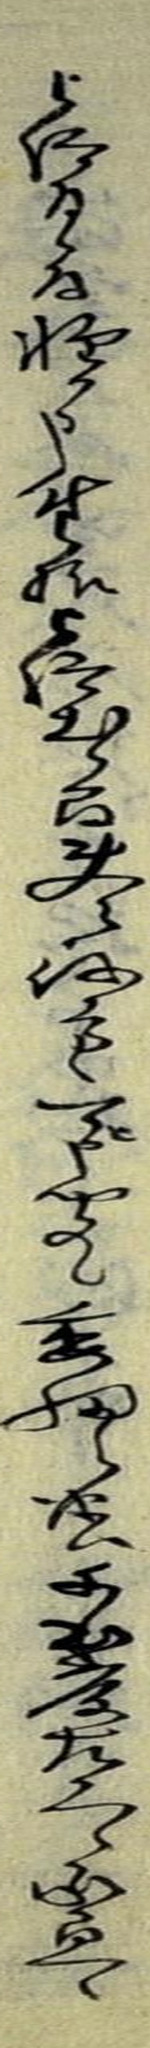被仰付候付軽ク申付候様被仰出候間夫々役方へ可被申聞候委細之儀ハ千本藤左衛門へ承置候
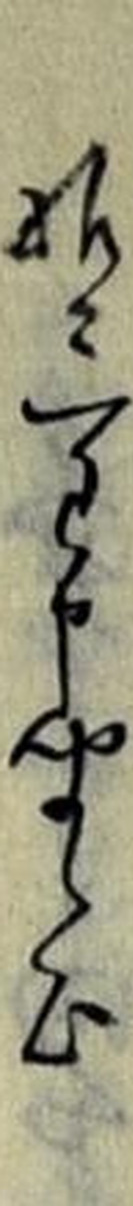様ニ可被申聞候以上
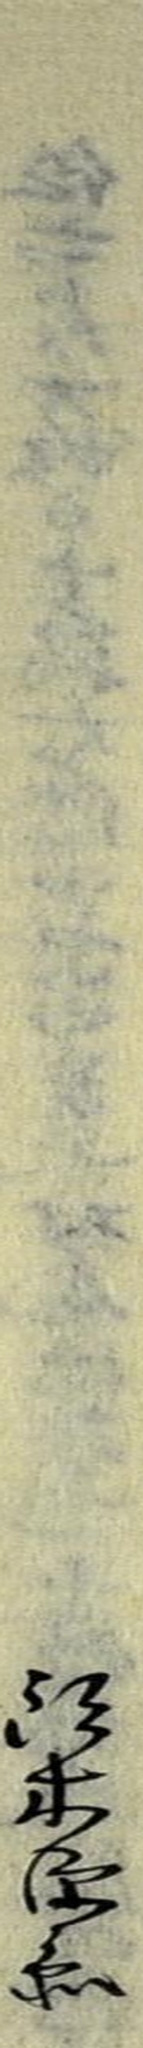鈴木源兵衛
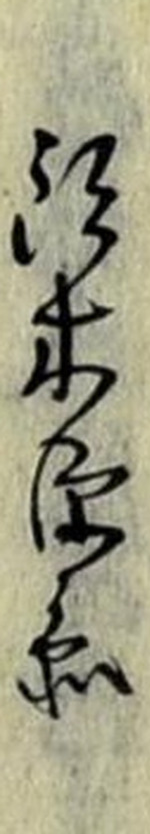鈴木源兵衛
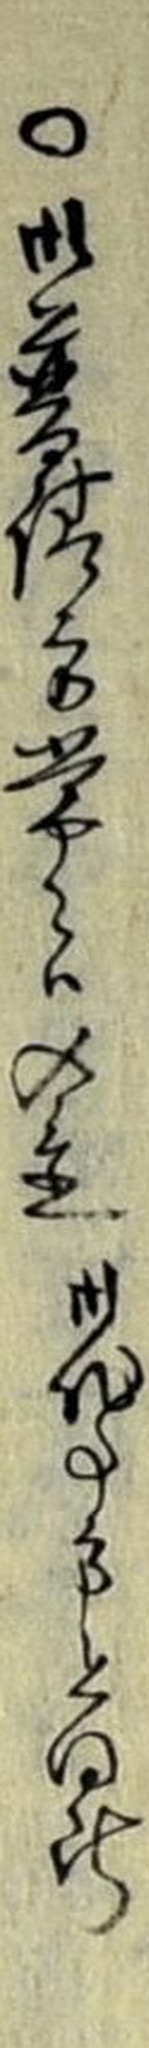〇御普請方常々ハ〆置御作事方と同断
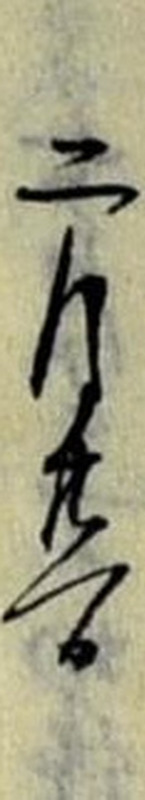二月廿一日
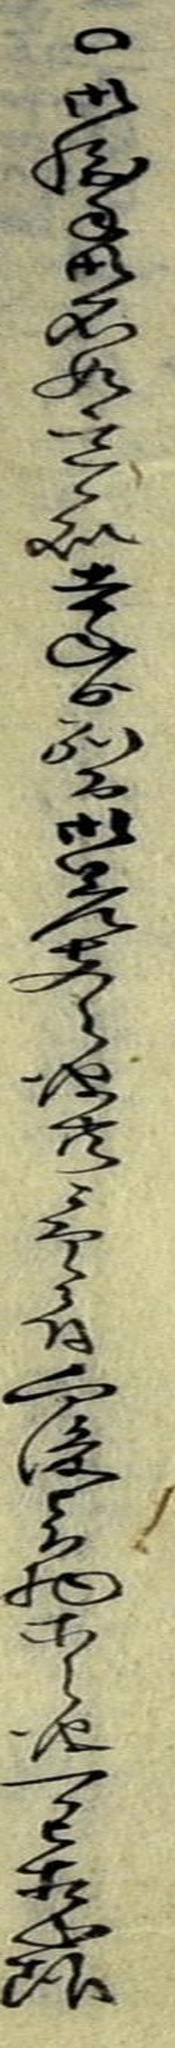〇御勝手御不如意候処去年ゟ別而御差支之儀共ニ而候ニ付向後被下物等之儀可被相止趣
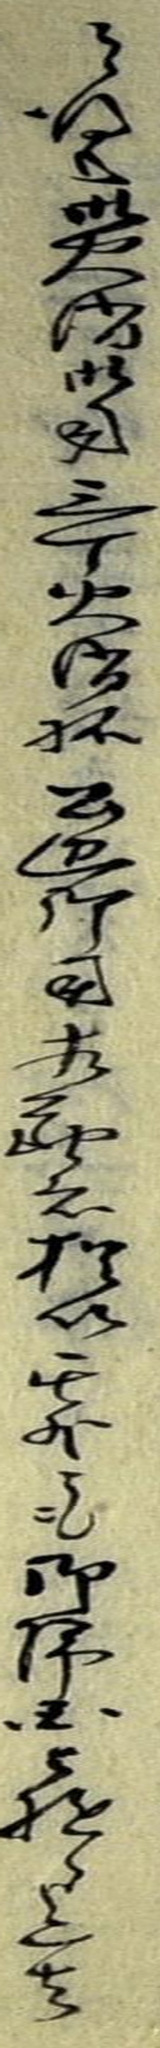ニ候得共御火消御用三丁火消抔公辺御用相勤者猶以其外ニも御帰国被遊候迄者
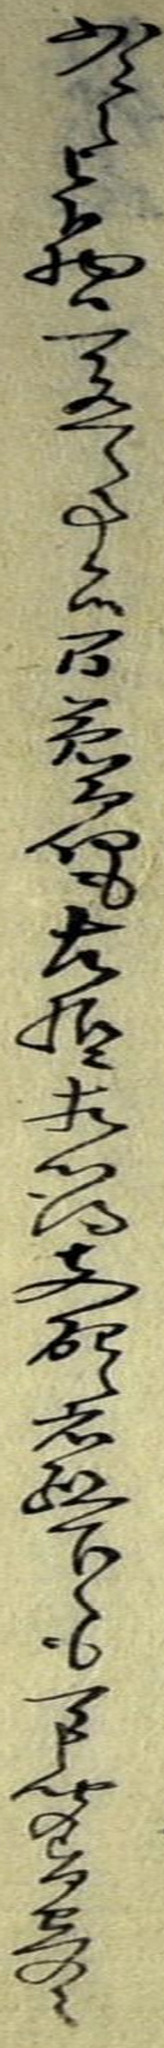少々之被下物ハ可有之事ニ候間兼而何も左様ニ相心得支配之者組下へも可申聞旨寄々

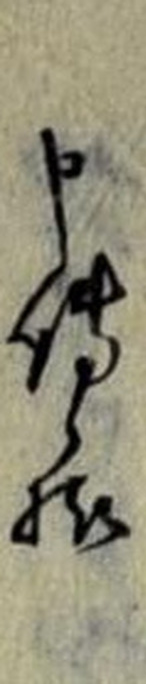申伝候様
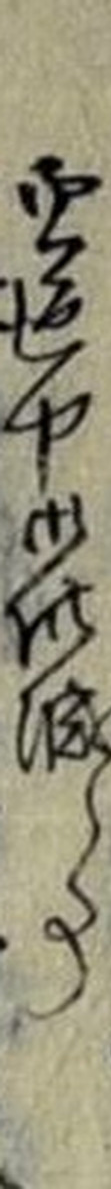御道中御供減之事
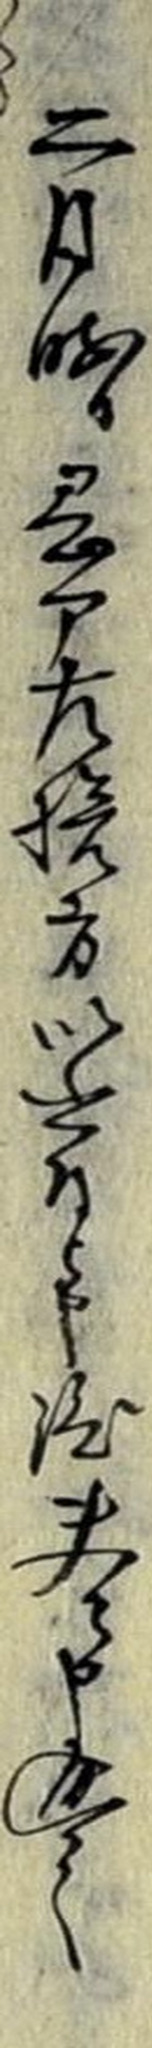二月晦日岡部左膳方以書付被申渡夫々申通之
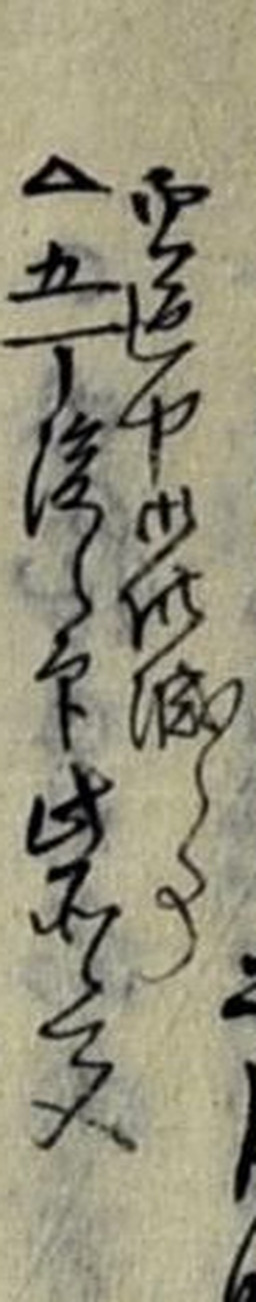△五丁後之印此所へ可入
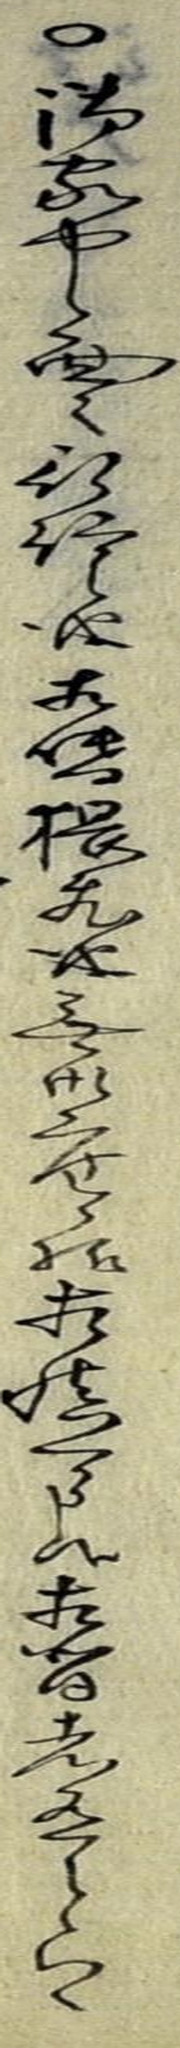〇御家中之面々行跡之儀相替猥敷儀無御座候様相慎可申候相背者有之候ハヽ
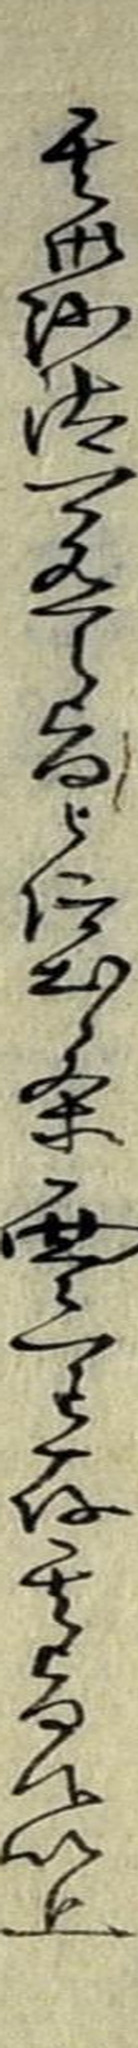其御沙汰可有之旨被仰出候条面々可被存其旨候以上
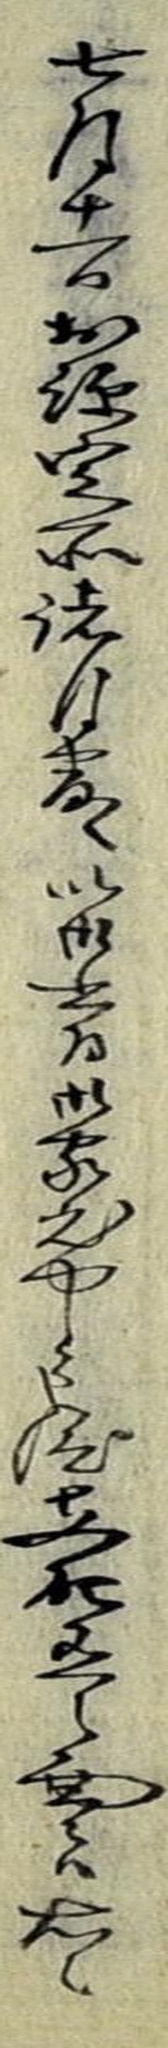七月廿一日於評定所諸月番へ以御書付御家老中被申渡支配有之面々ハ右之
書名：命令之部 一
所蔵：福井県文書館 Fukui Prefectural Archives
